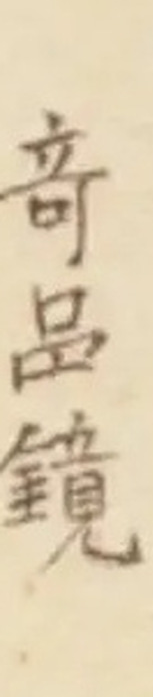竒品鏡

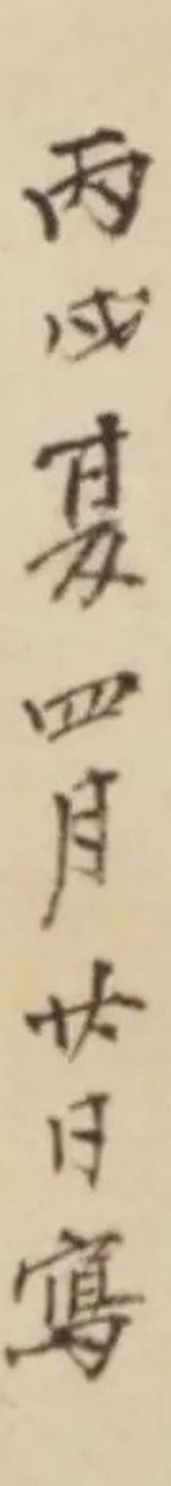丙戌夏四月廿日寫
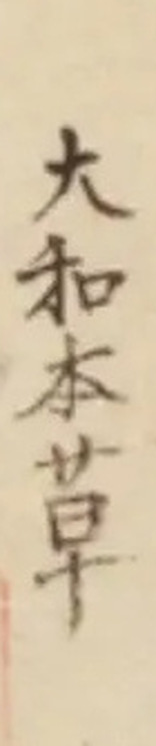大和本草
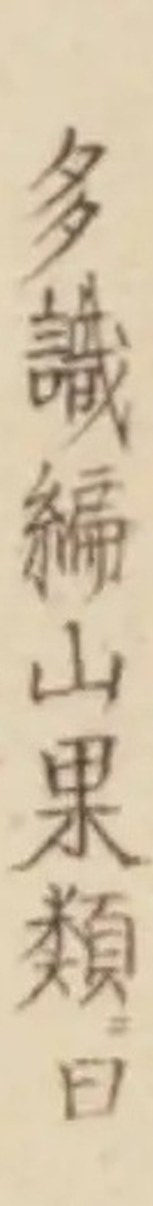多識編山果類に曰
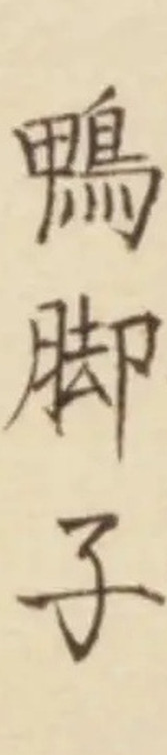鴨脚子

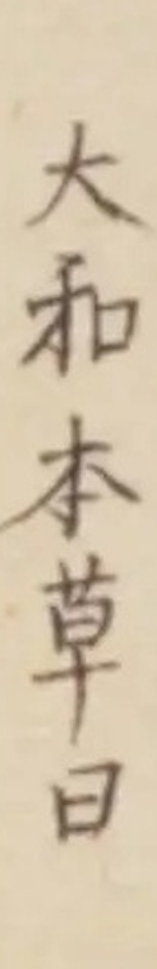大和本草曰
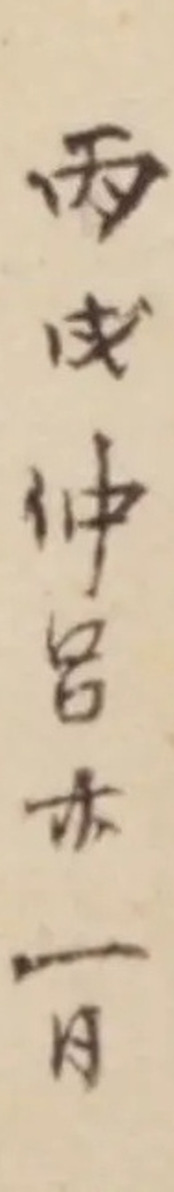丙戌仲呂亦一日
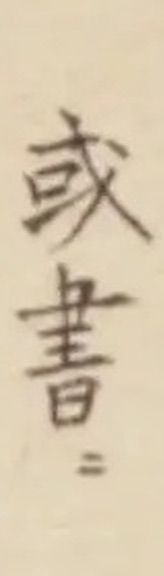或書に
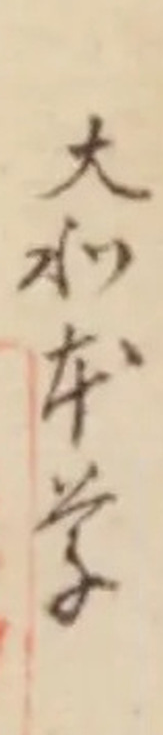大和本草
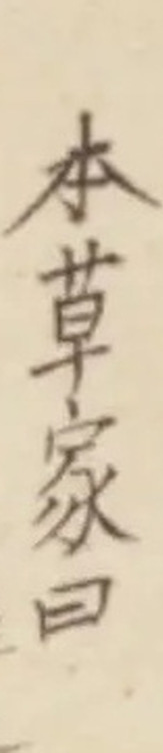本草家曰
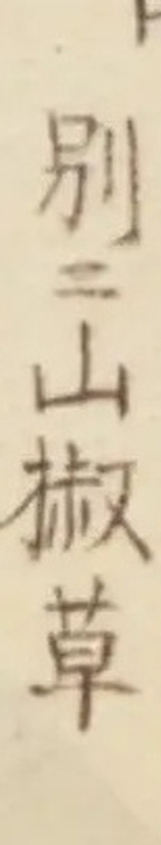別に山椒草
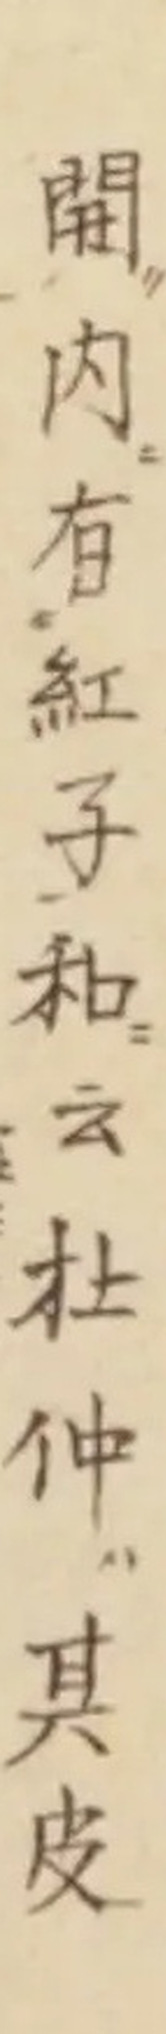開く内に有紅子和に云杜仲は其皮
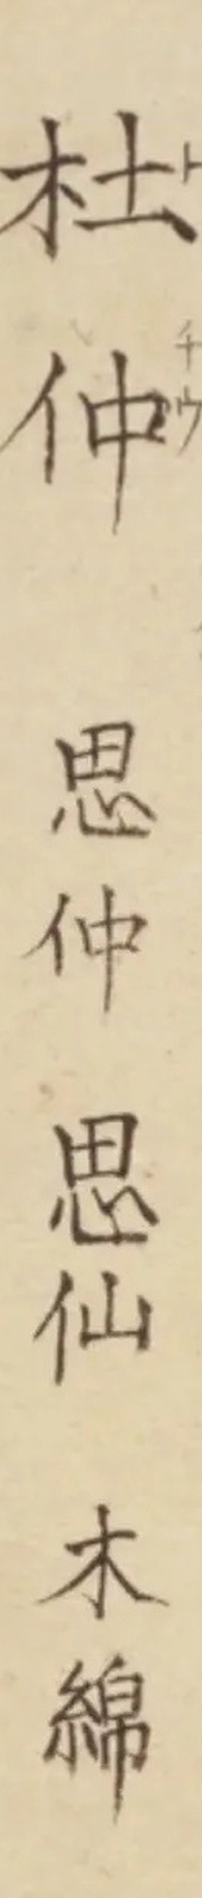杜仲思仲思仙木綿
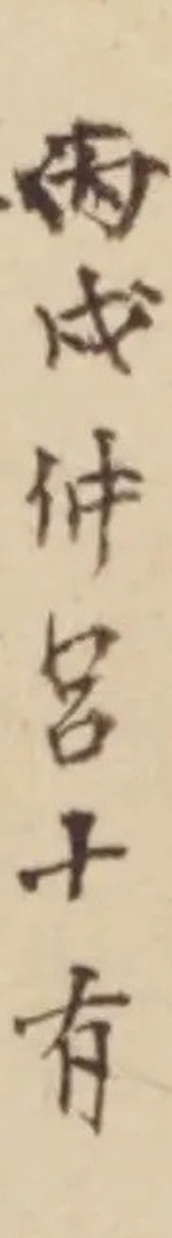丙戌仲呂十有
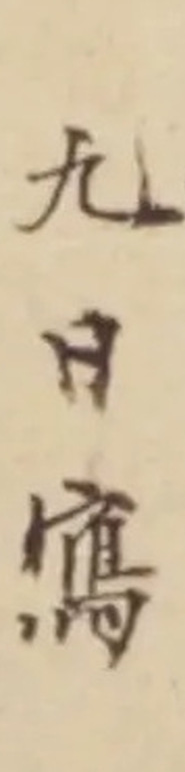九日寫
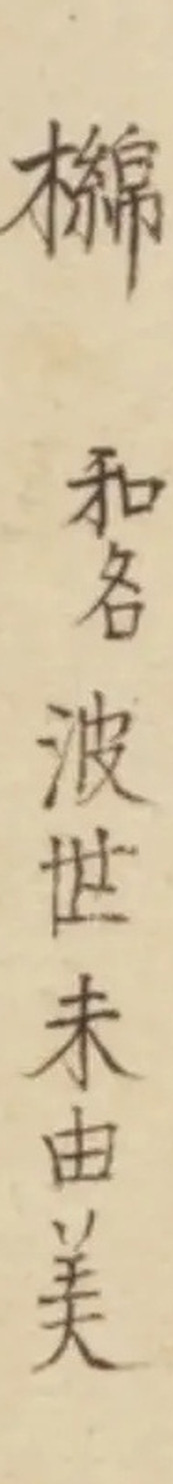檰和名波世未由美
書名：梅園草木花譜夏之部. 3
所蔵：国立国会図書館 National Diet Library, JAPAN
